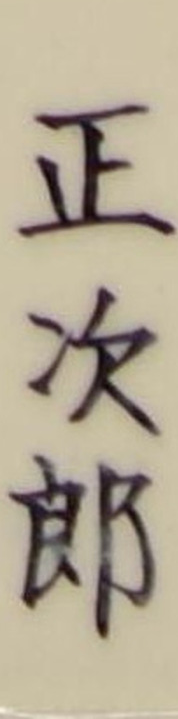正次郎
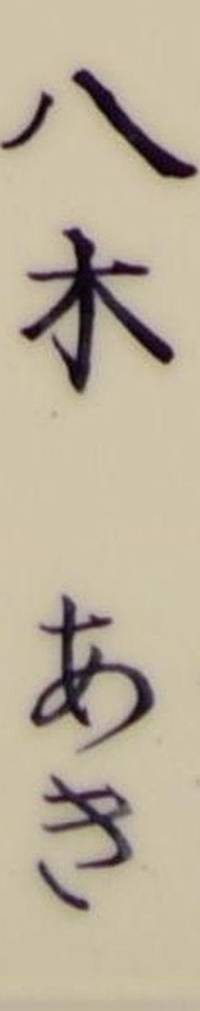八木あき
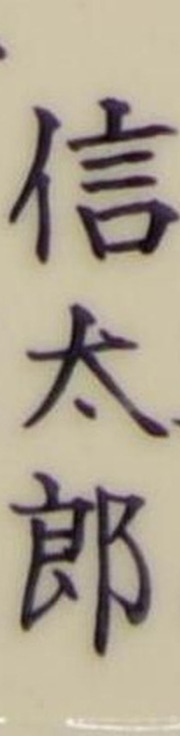信太郎
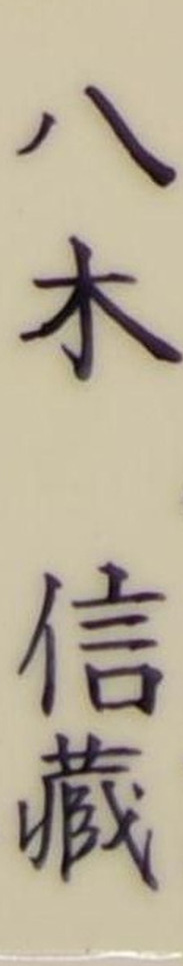八木信蔵

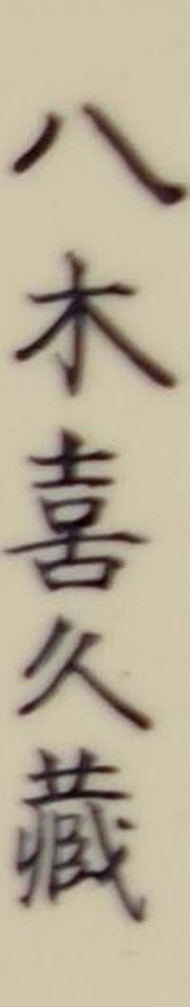八木喜久蔵
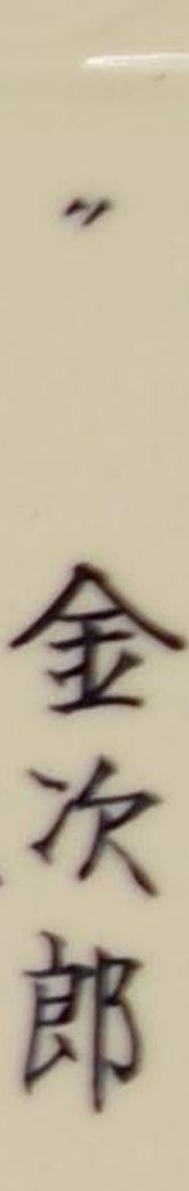金次郎
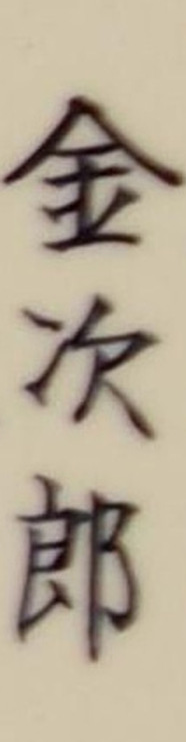金次郎
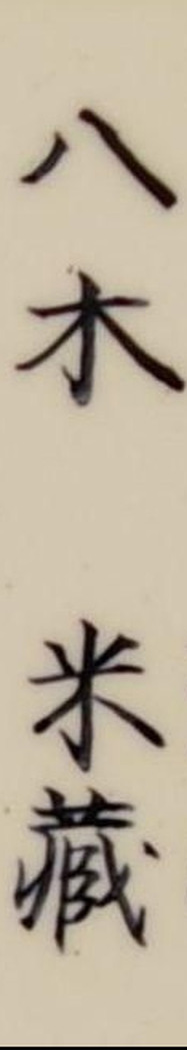八木米蔵
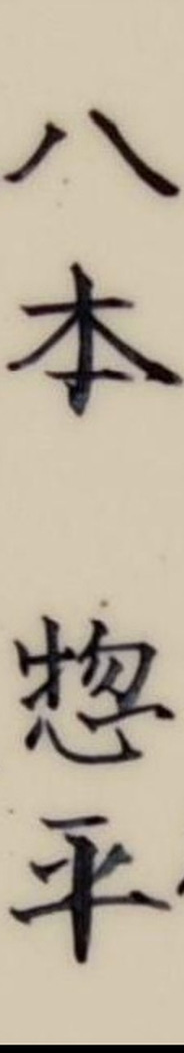八本惣平
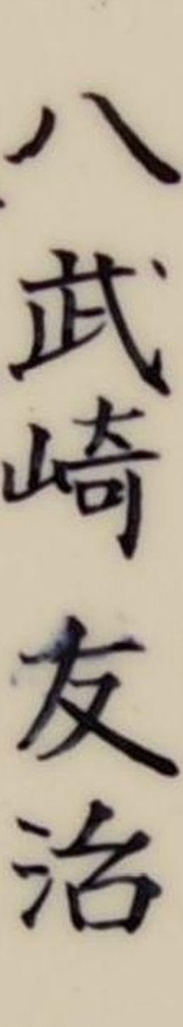八武崎友治
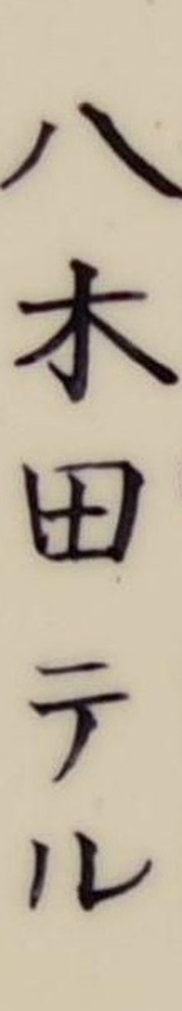八木田テル
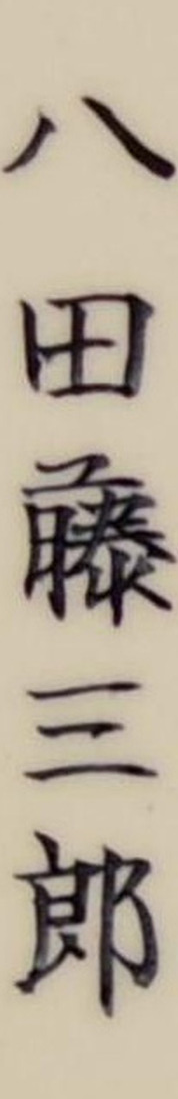八田藤三郎
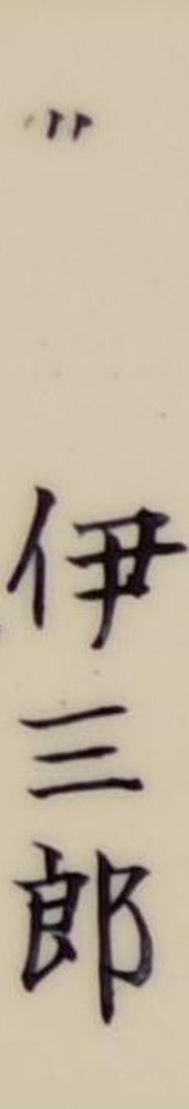伊三郎
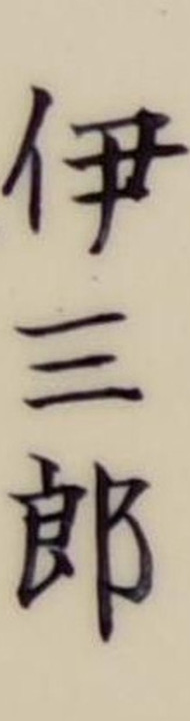伊三郎
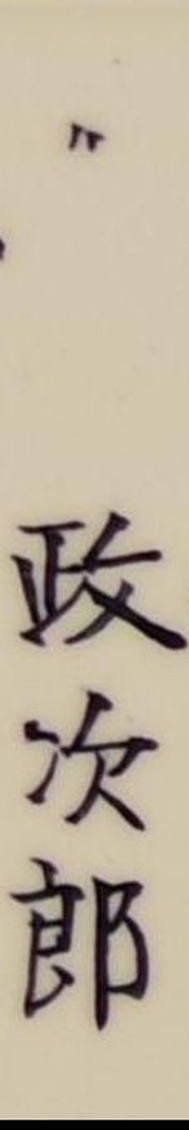政次郎
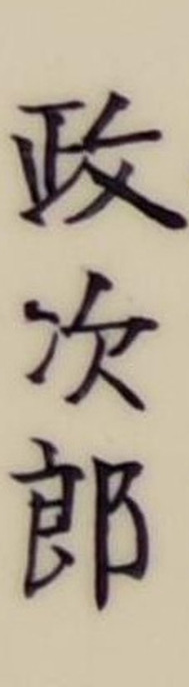政次郎
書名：E~L
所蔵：高野山金剛峯寺
